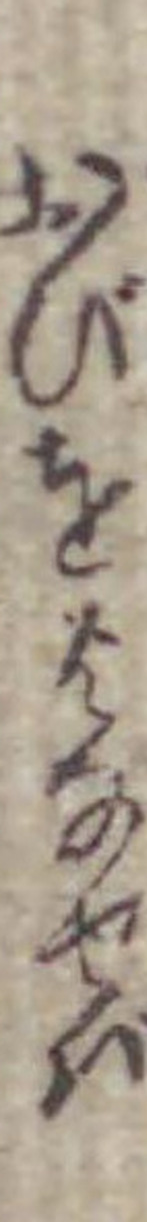おびをはなせば
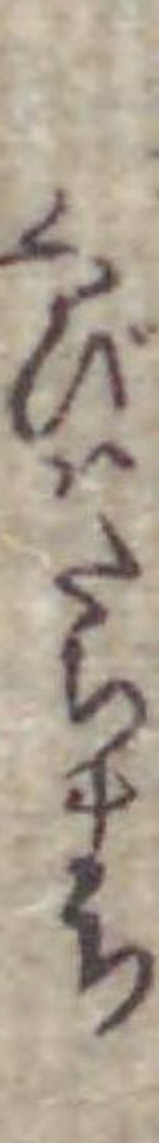くびはたちまち
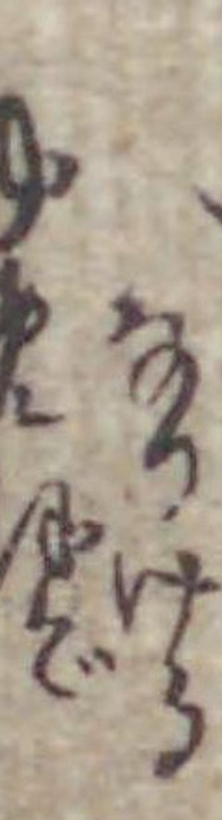ゆめほど
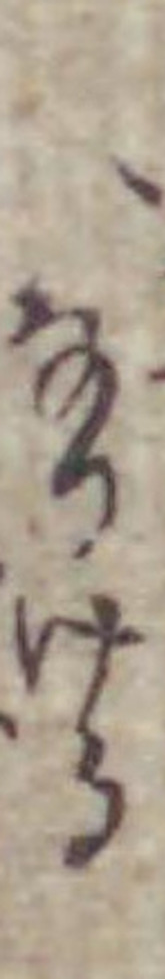なりける
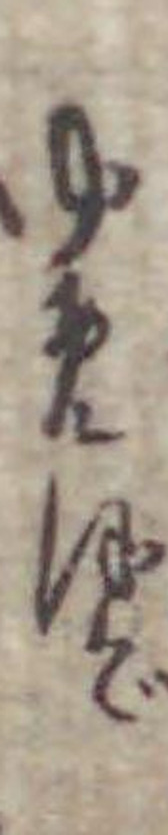ゆめほど
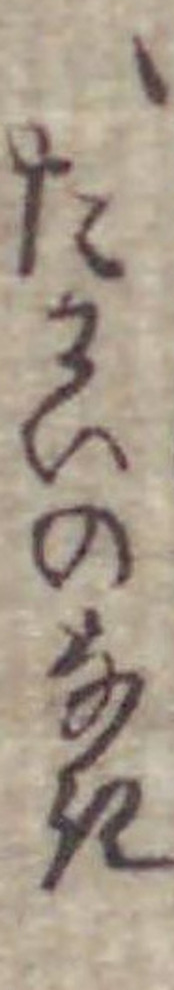たわいのなき
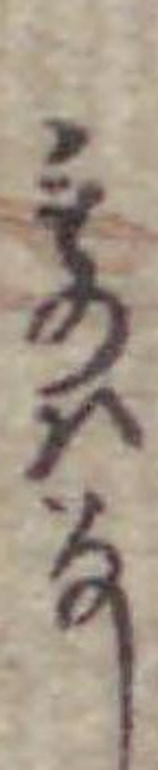ものはなし

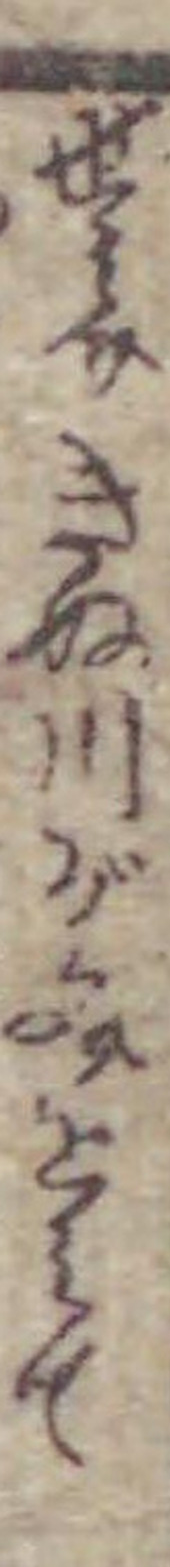世之介きぬ川が夢をみて
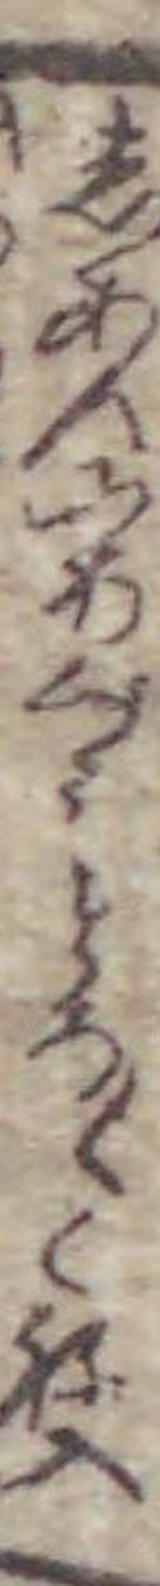しあんにあぐみをろ〳〵とね入
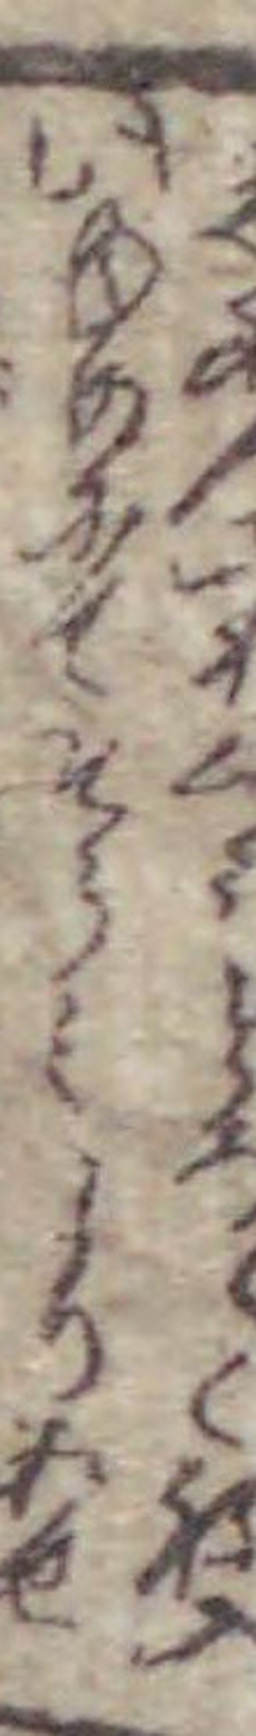此ゆめにてそうみりあせ
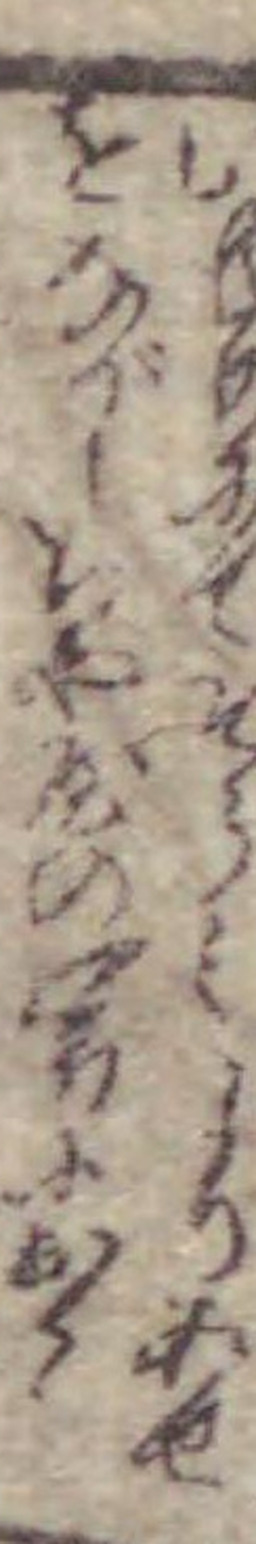をながしちや屋の男におこ
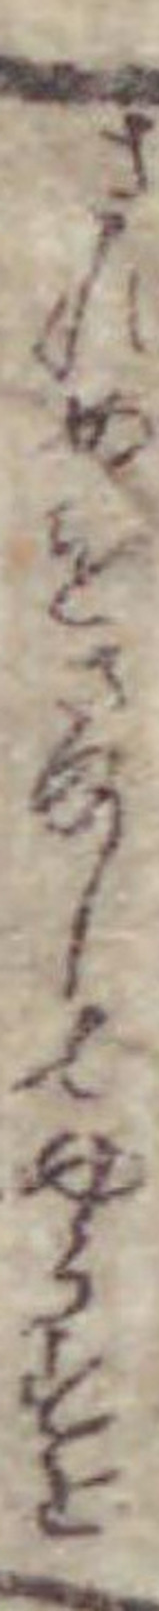されめをさましてやうすを
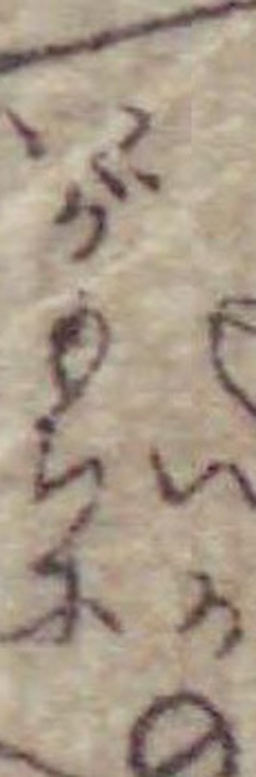いがもちに
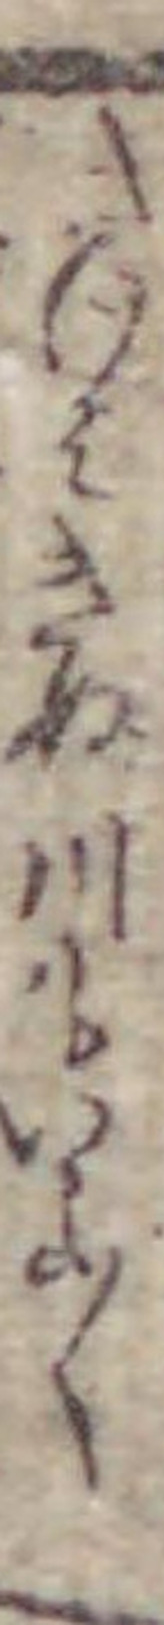きけはきぬ川もいよ〳〵
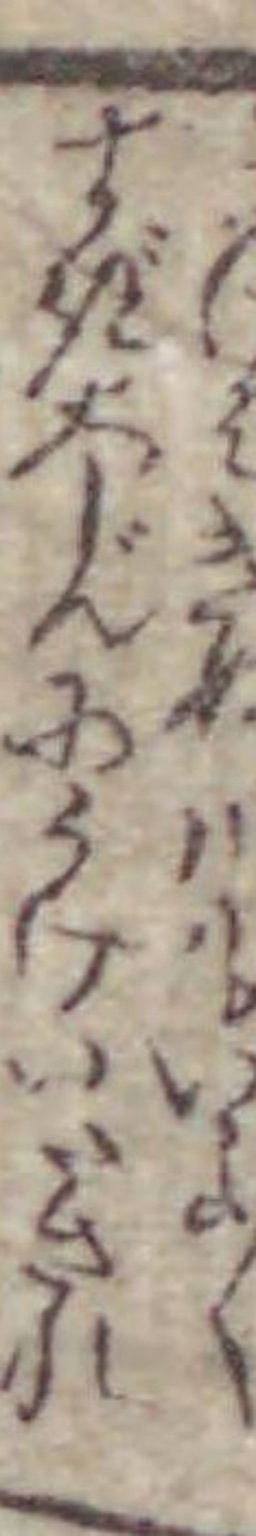すぎ大じんにうけいたされ
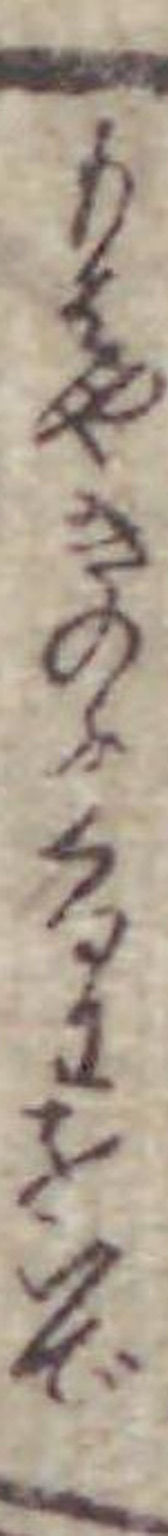もはやきのふくるわをいで
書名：嗚呼不侭世之助噺 : 3巻
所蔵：国立国会図書館 National Diet Library, JAPAN
